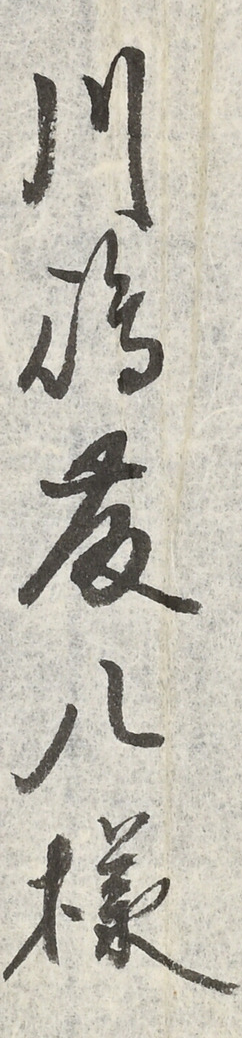川嶋藤八様

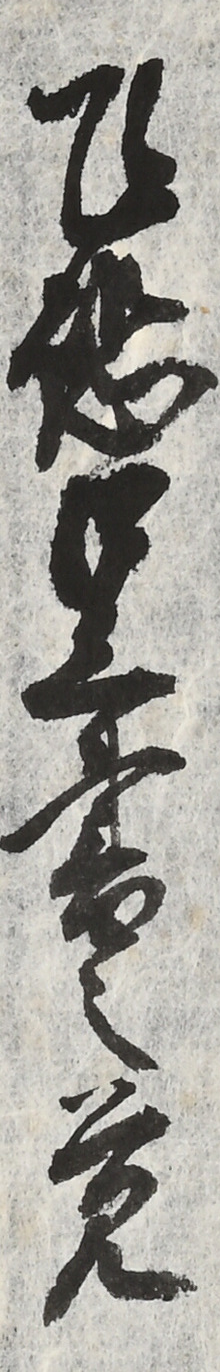乍恐口上書之覚
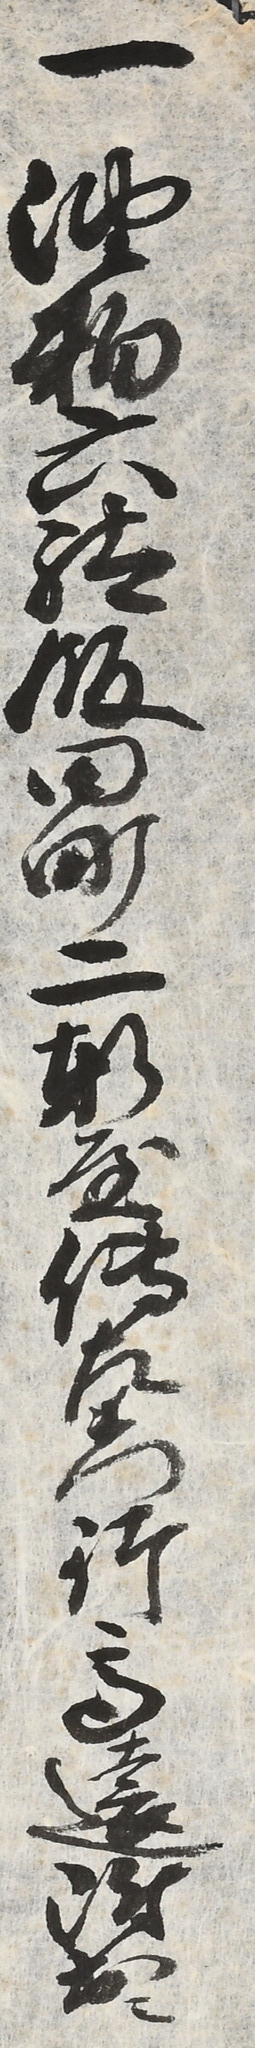一油粕六駄飯田町二軒屋伝左衛門行高遠附出ニ
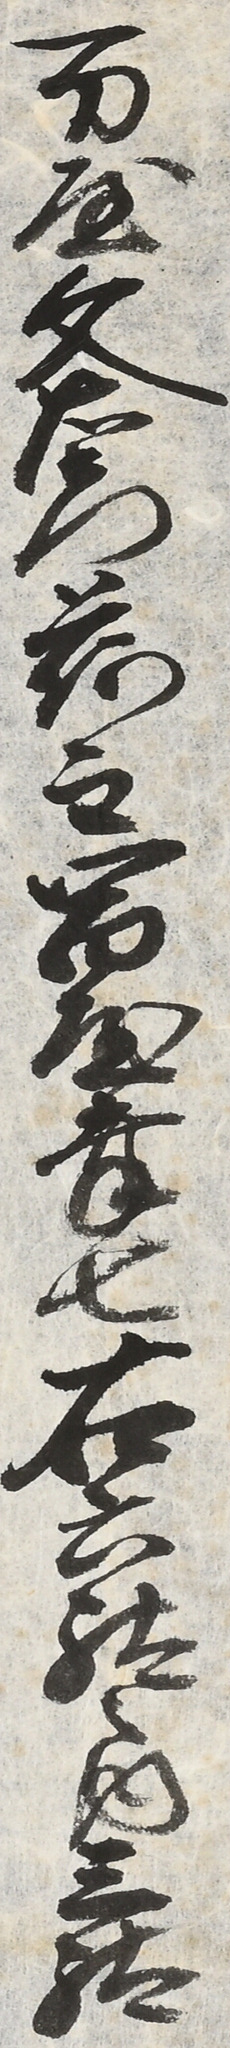万屋文右衛門荷主冨屋幸七右六駄之内三駄
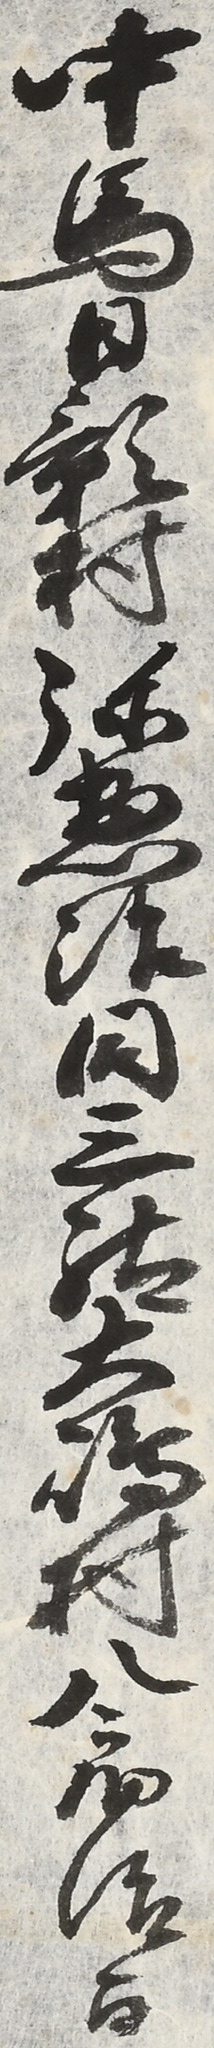中馬日影村弥惣治同三駄大嶋村八郎治と
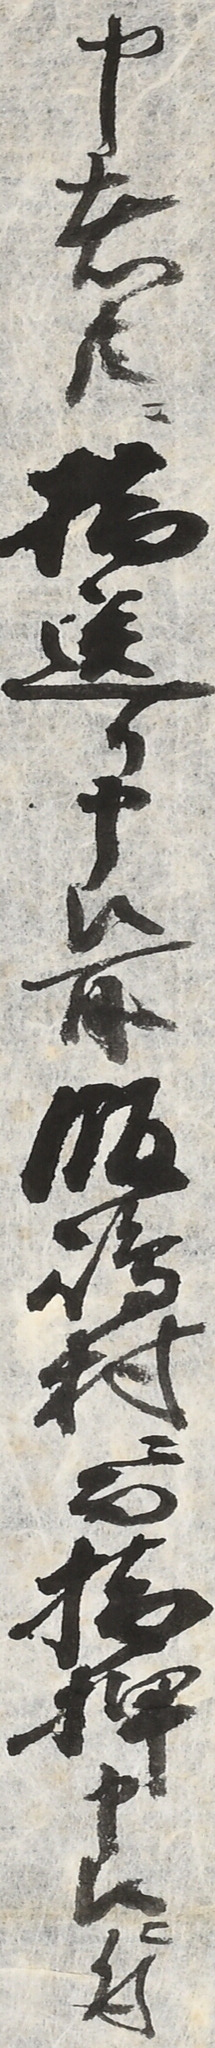申者共ニ指送り申候所飯嶋村ニ而指押申候ニ付
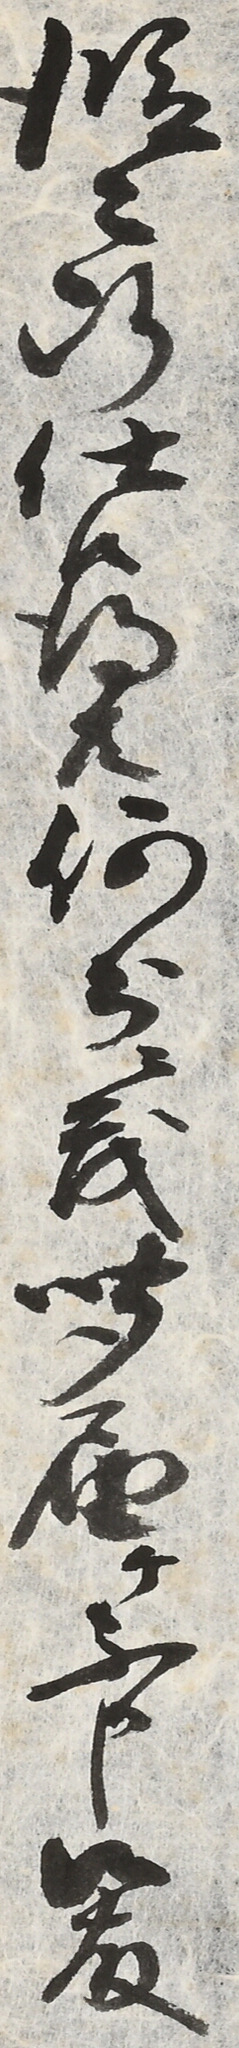段々断仕候得共何分ニも聞届ヶ不申候故
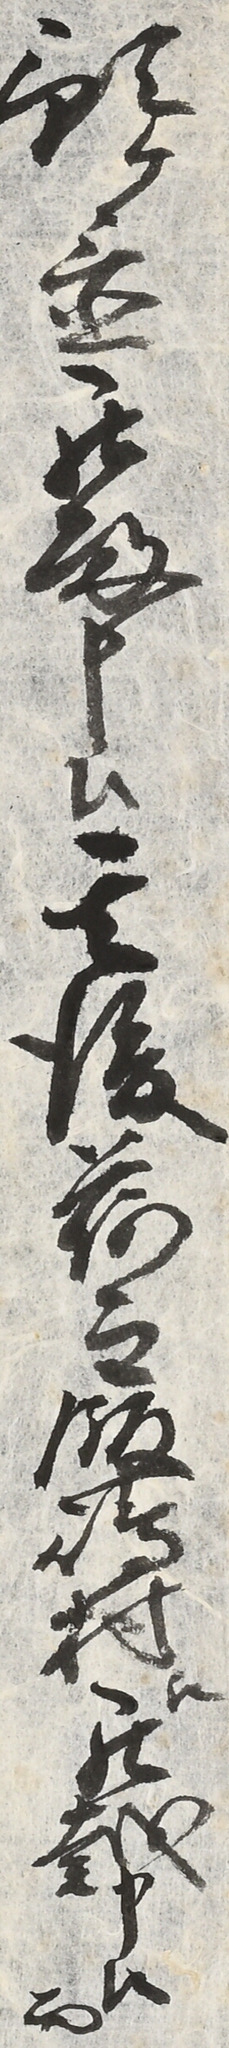預ヶ置罷帰申候其後荷主飯嶋村江罷越申候而
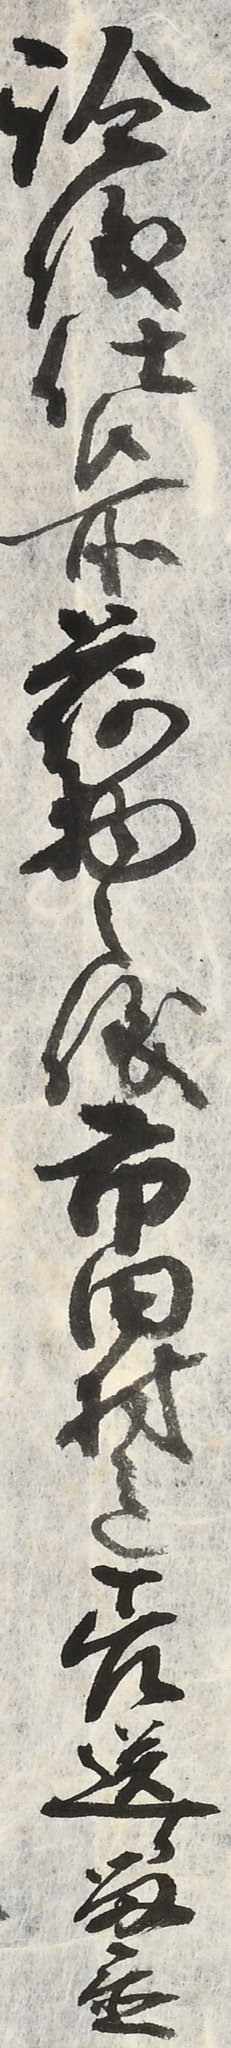詮儀仕候所荷物之儀市田村迄差送り留置
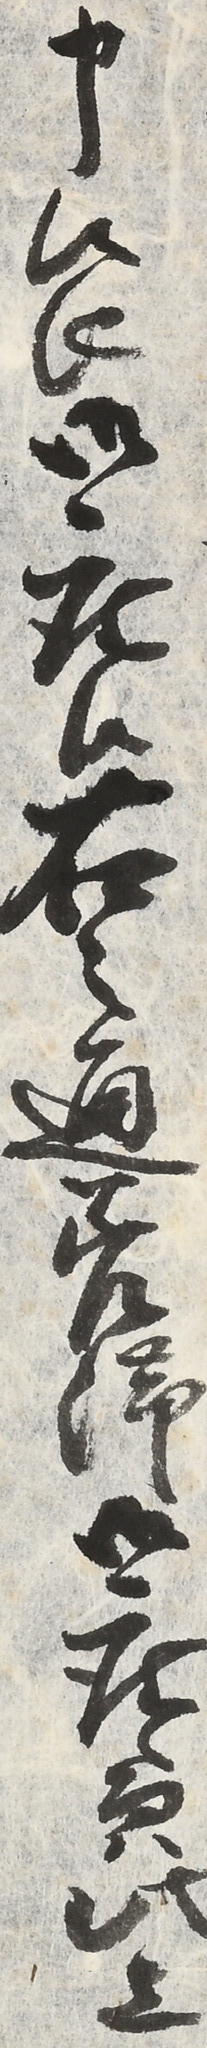申候趣御座候右之通差障御座候而ハ此上
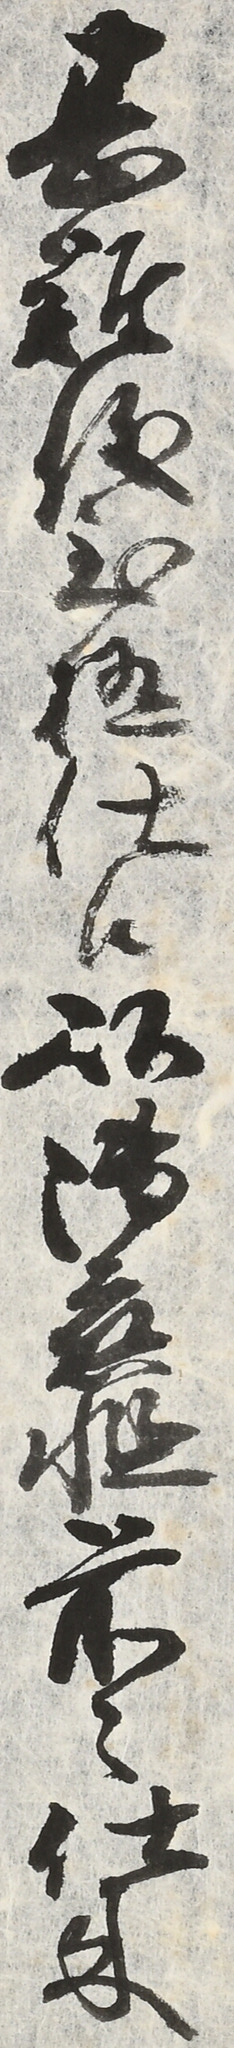甚難儀至極仕候以御慈悲前々仕来
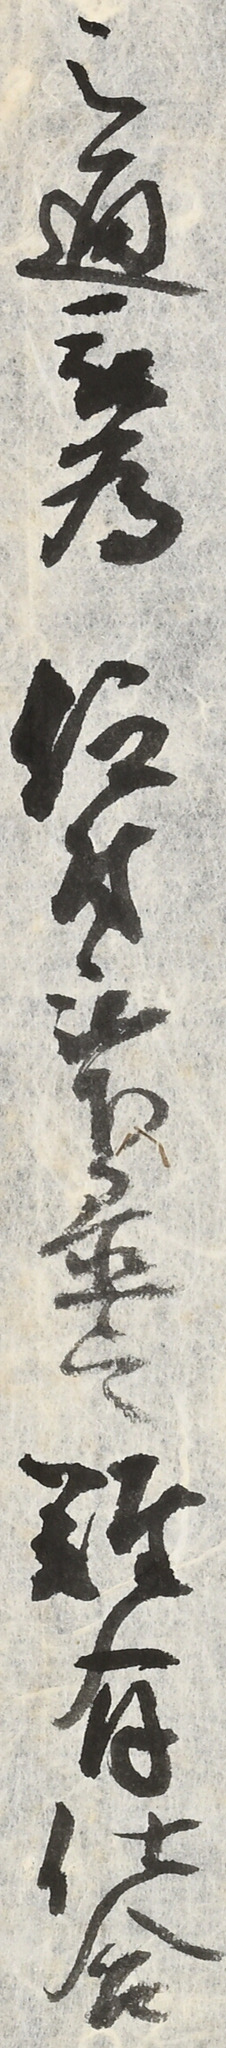之通被為仰付被下置候ハヽ難有仕合
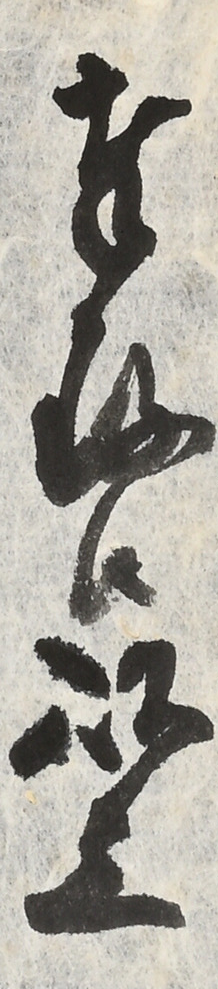奉存候以上
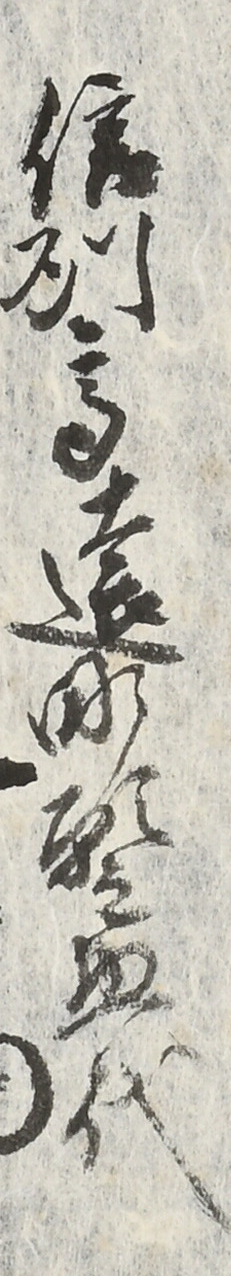信州高遠町願主惣代
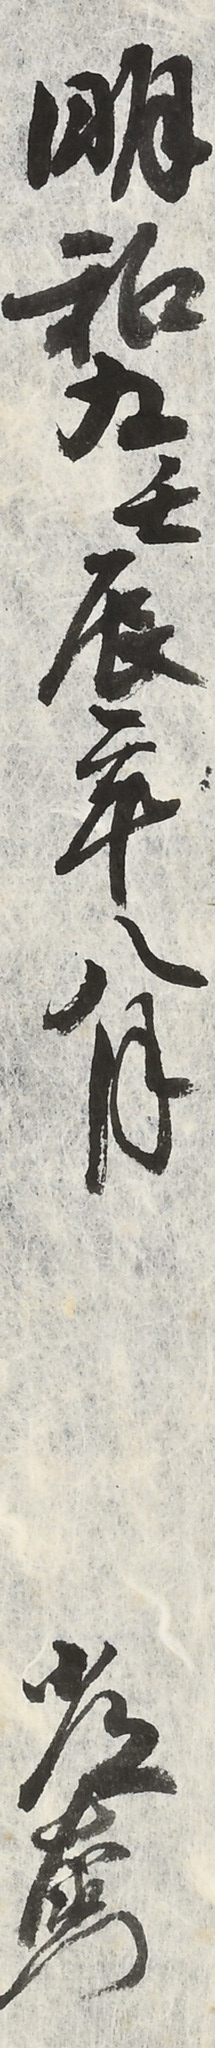明和九壬辰年八月常右衛門
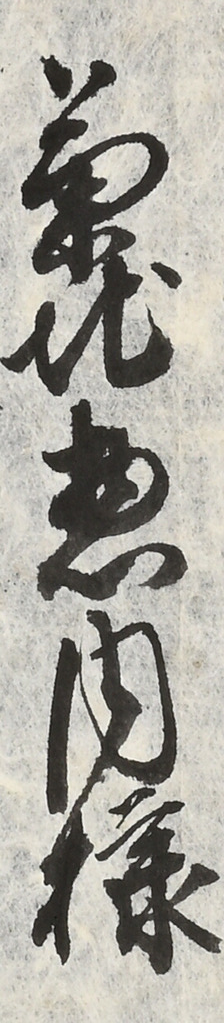菊地惣内様
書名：乍恐以書付御訴訟申上候御事
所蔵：伊那市立高遠町図書館・合同会社AMANE
